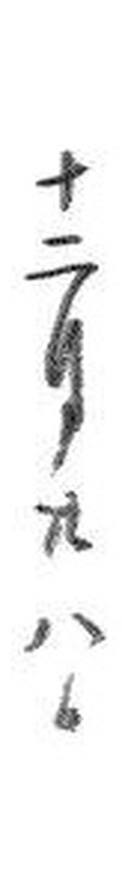十二月廿八日
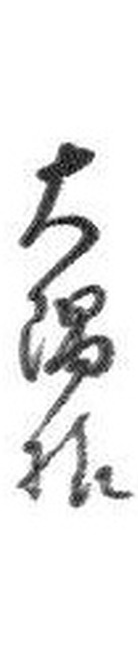大隅様
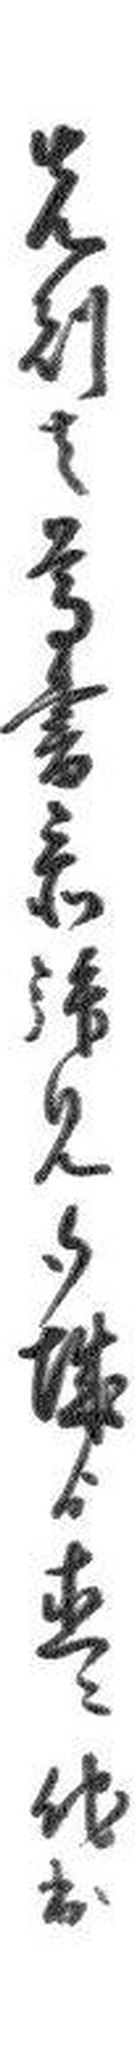先刻者尊書忝拝見御城ゟ直ニ他出
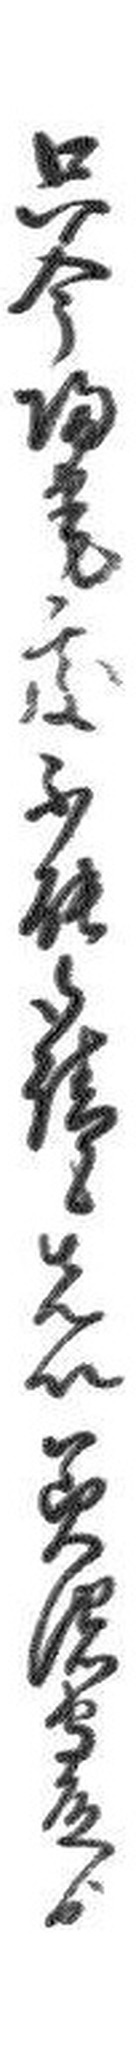只今帰宅処不能御請候先以美濃守殿ゟ

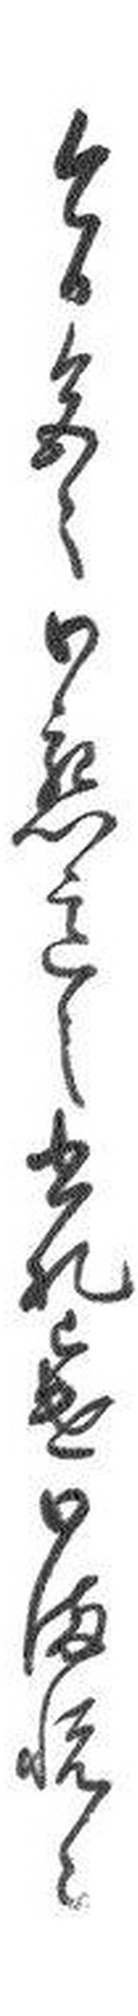今日色々御懇意之書札被遣御満悦被
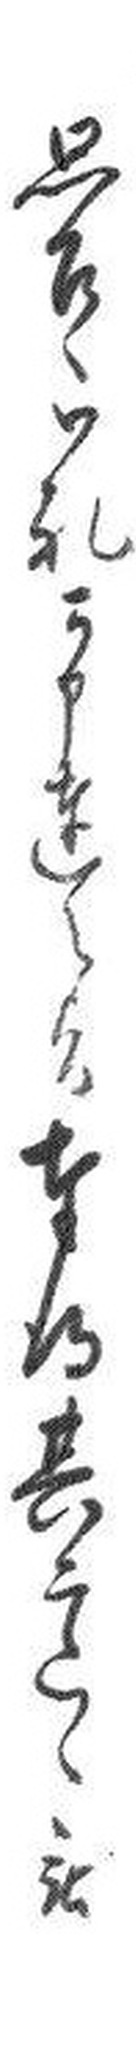思召候御礼可申達之旨奉得其意候被
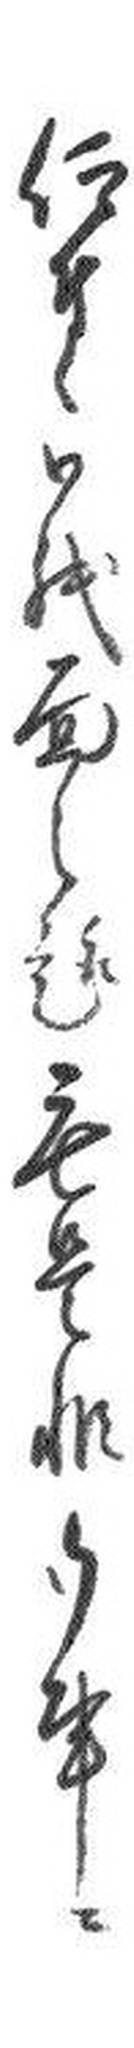仰付候御紙面之趣無是非御事ニ
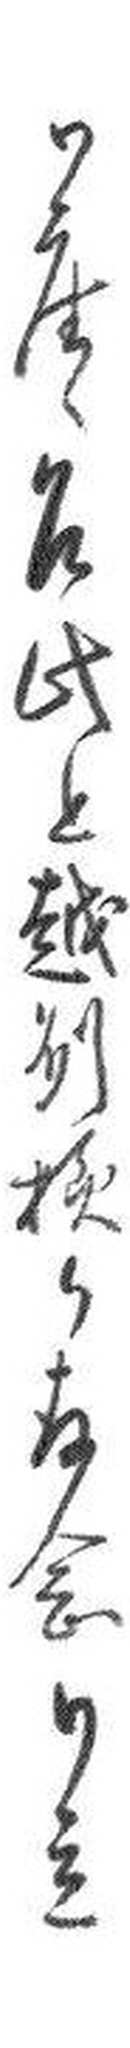御座候乍此上越州様御存念御立
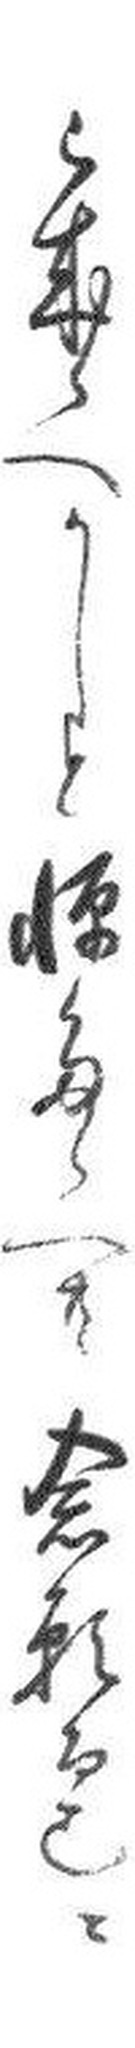被成候へかしと憚多候へ共念願而已ニ
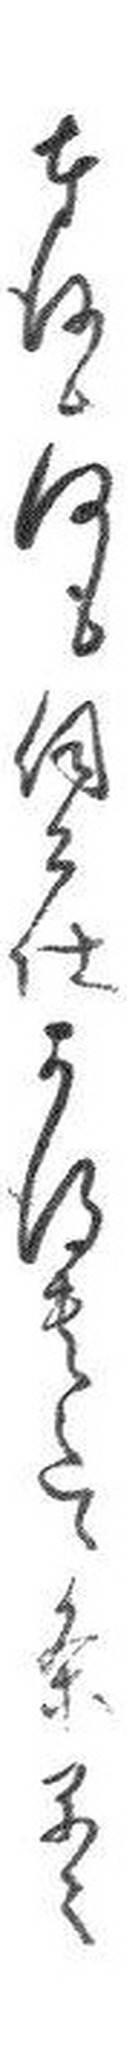奉存候何も伺公仕可得貴意候条早々
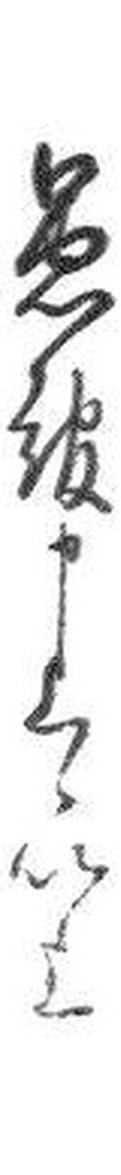愚報申上候以上
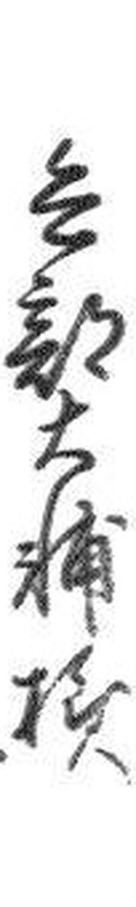兵部大輔様
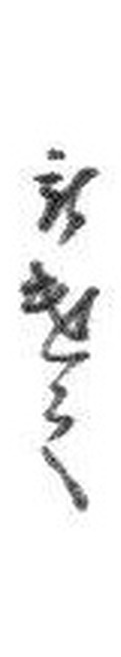被遣之
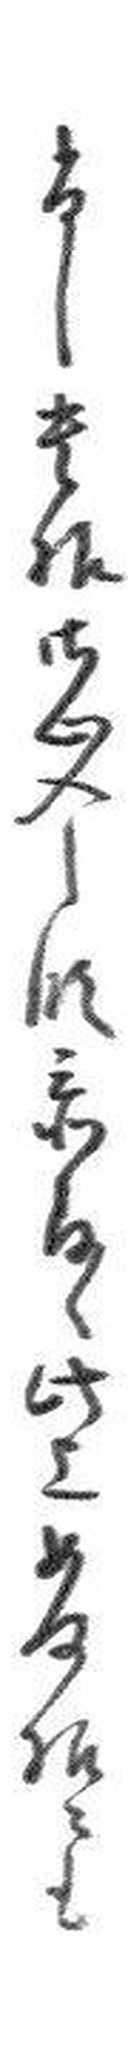尚々貴様御心入可之段忝存候此上如何様ニも
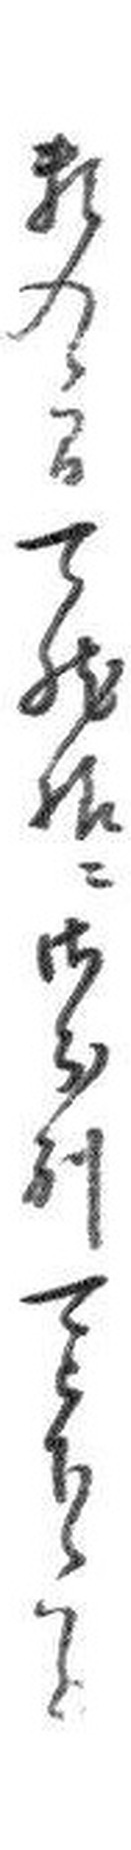頼入候間可然様ニ御分別可被下候以上
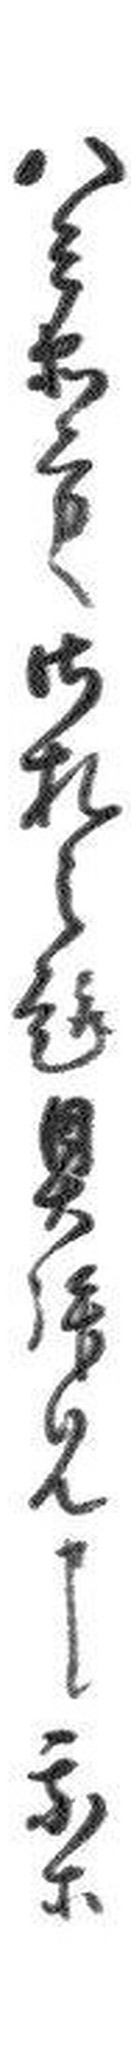八兵衛方へ御札之趣具拝見申候我等
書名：家譜 十一 昌親公 従延宝二年到延宝四年八月
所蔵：福井県文書館 Fukui Prefectural Archives
